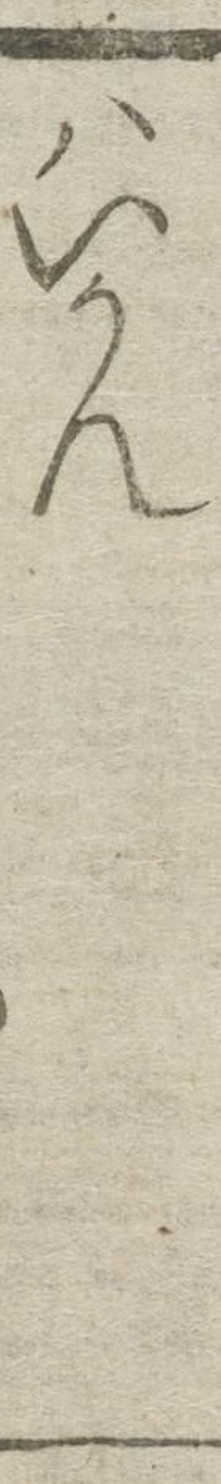はいかん
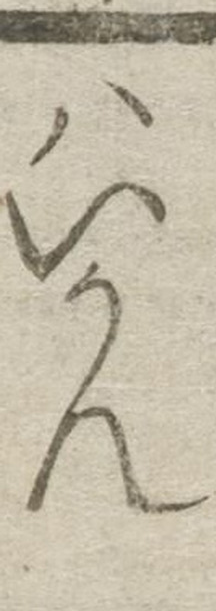はいかん
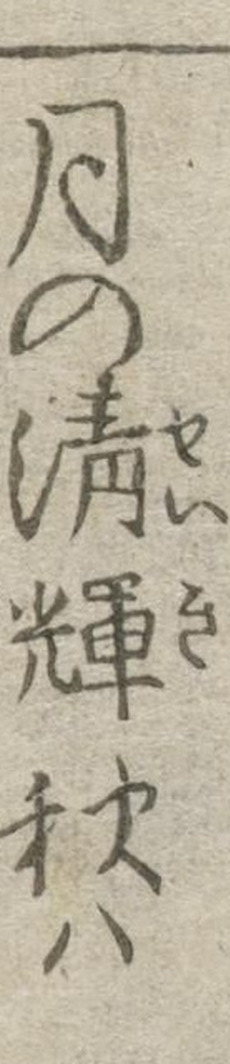月の清輝秋は
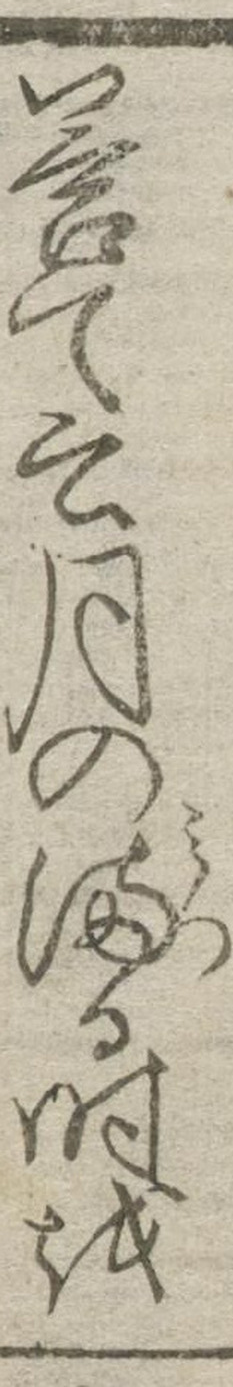答て云月の満る時を
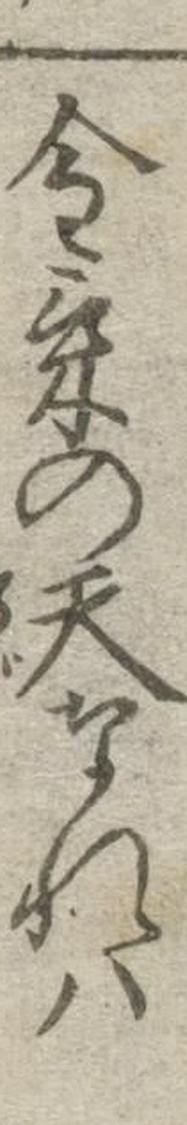金気の天なれは
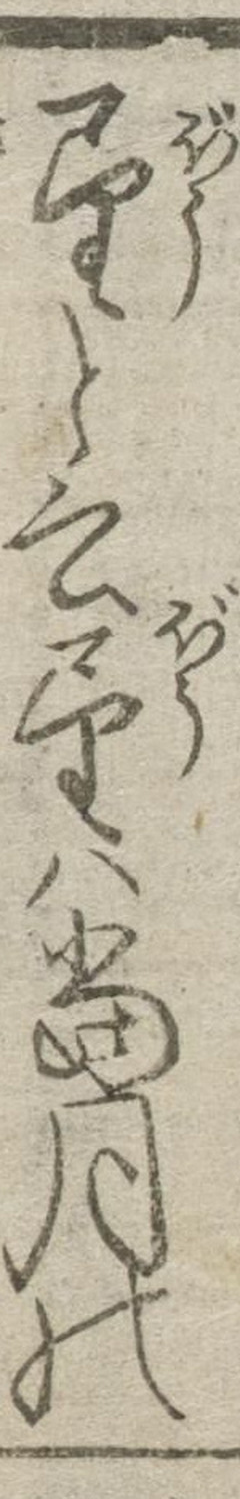望と云望は当月の
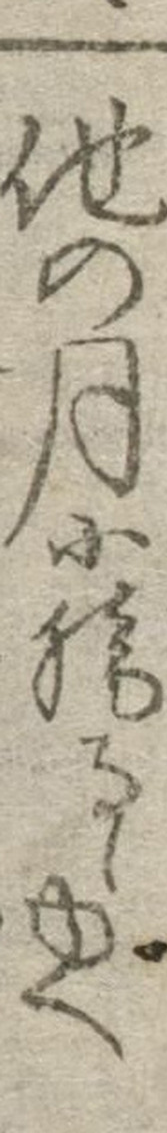他の月に勝るゝゆへ
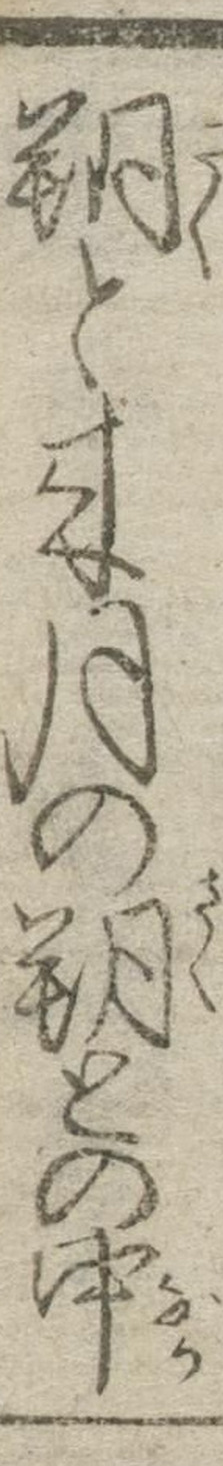朔と来月の朔との中
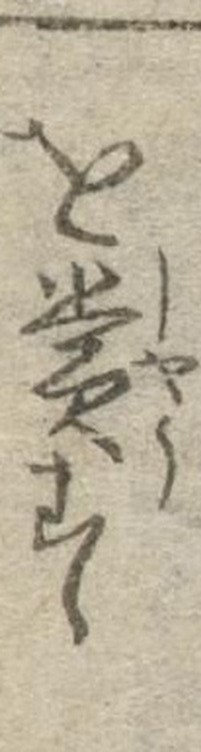を賞す

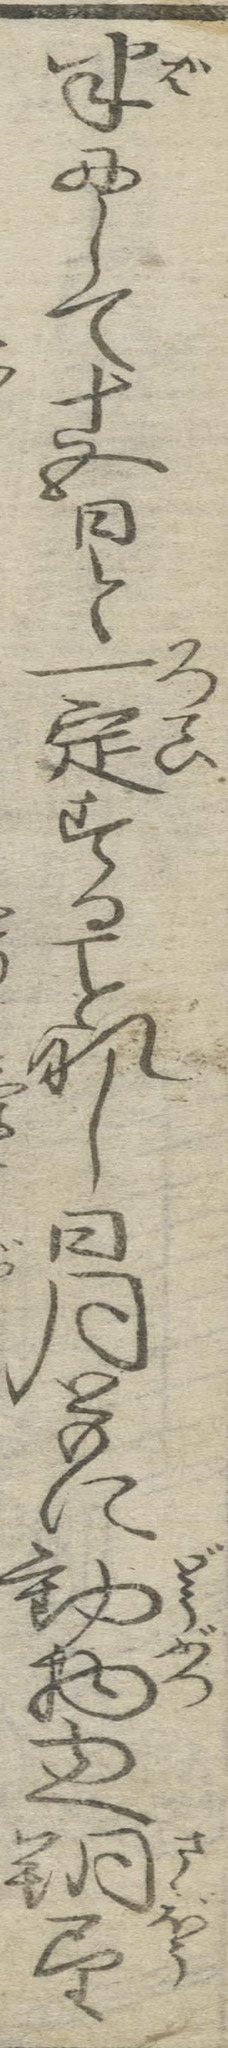半にして十五日を一定することなし日月ともに動物ゆへ朔望
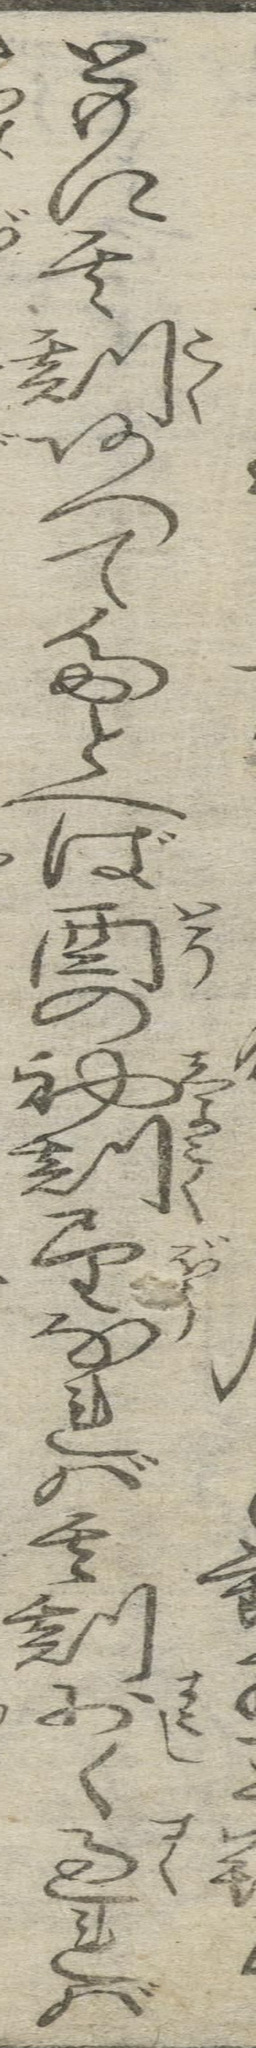ともに其刻あへてたとへば酉の初刻望なれば其刻少く過れば
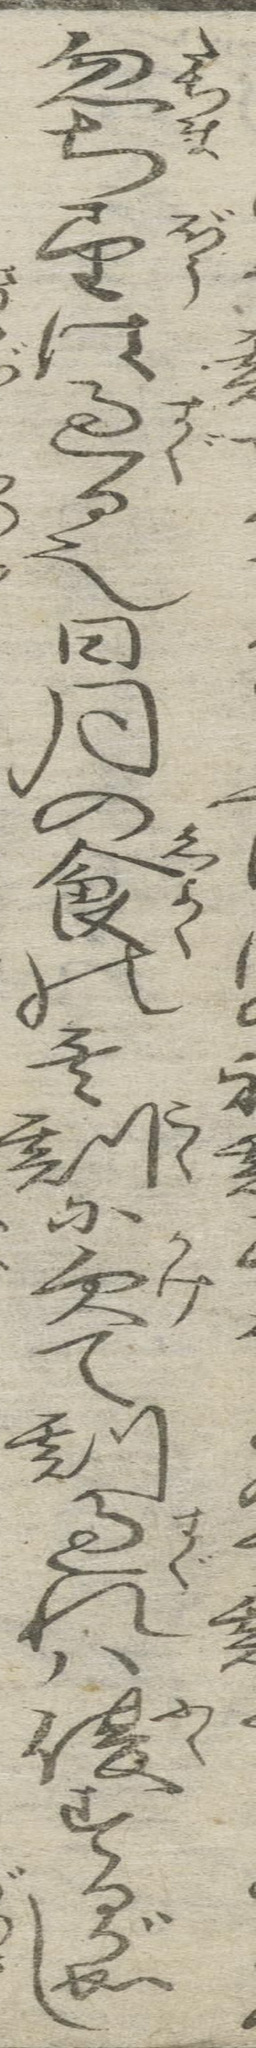忽ち望は過る也日月の食の其刻に欠て刻過れは復するが如し
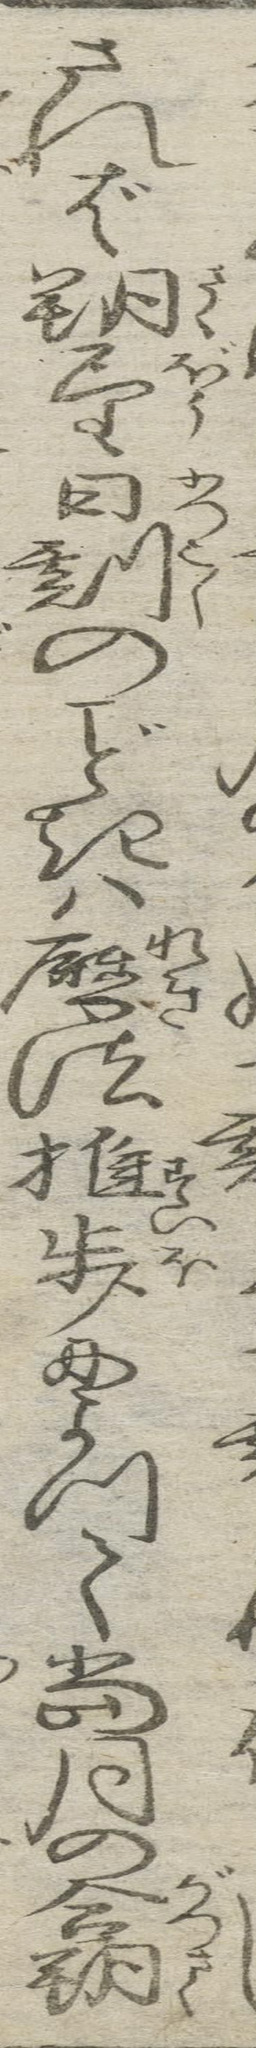されば朔望日刻のごときは暦法推歩によつて当月の合朔
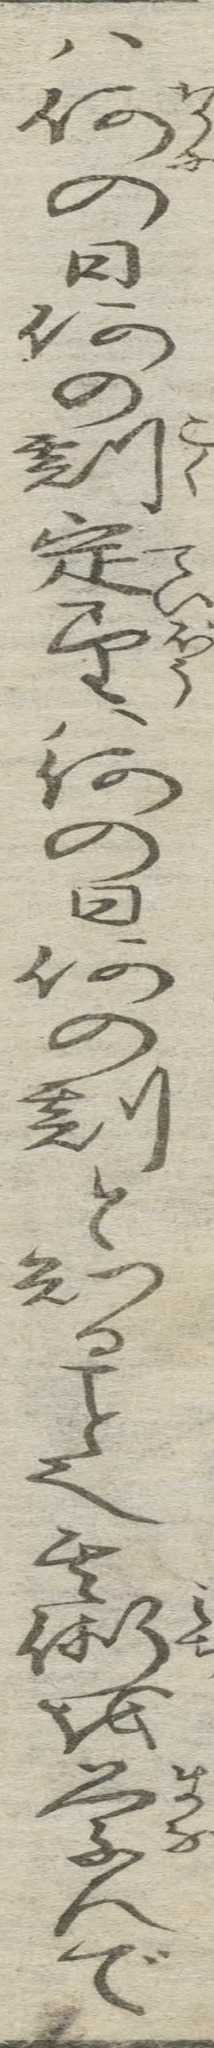は何の日何の刻定望は何の日何の刻と知ること也其術を学んで
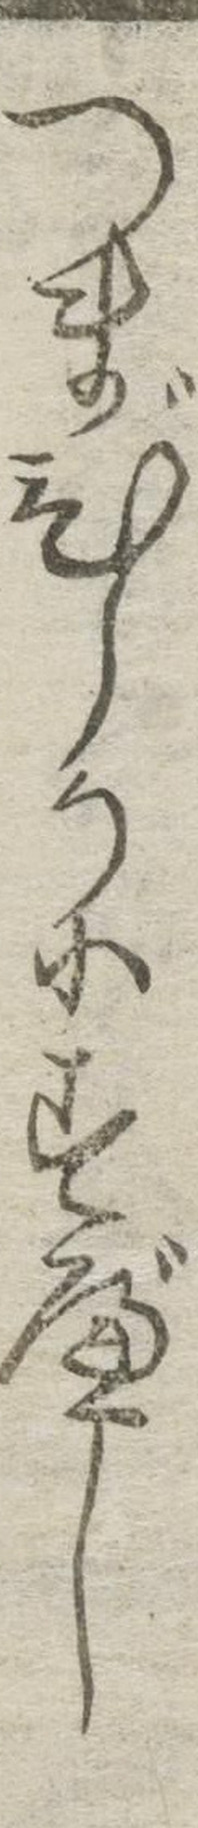つまびらかにすべし
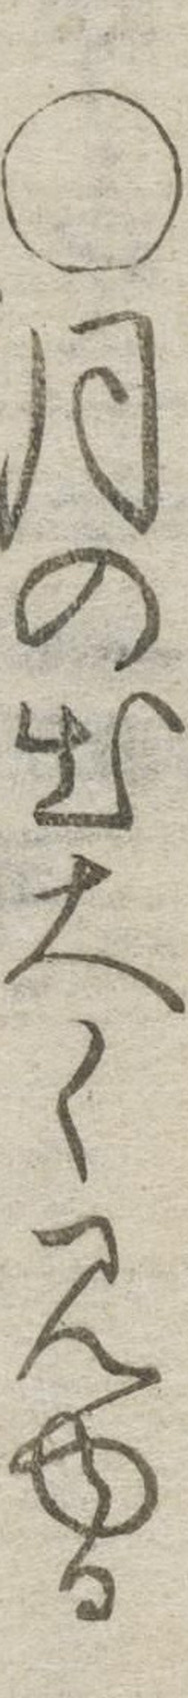○月の出大く見ゆる
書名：訓蒙天地辨　天
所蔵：東京大学地震研究所図書室 Earthquake Research Institute Library, The University of Tokyo, JAPAN
